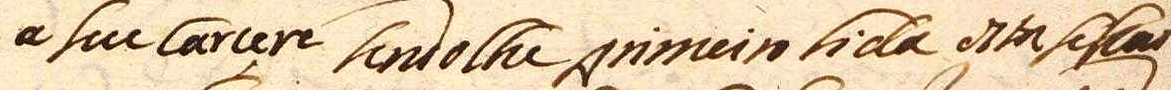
a seu carcere, sendolhe primeiro lida esta sessaõ
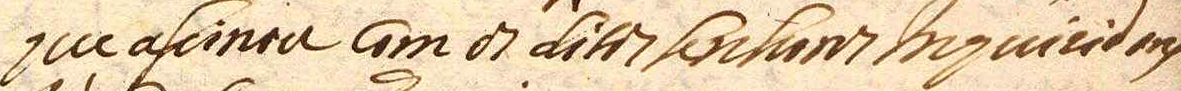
que assinou com os ditos senhores Inquizidores
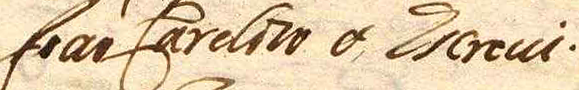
Joaõ Cardozo o Escreui.
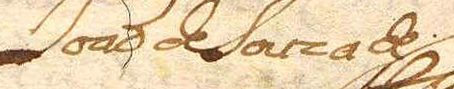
Ioão de Souza de
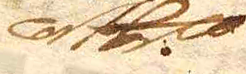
Castb.co
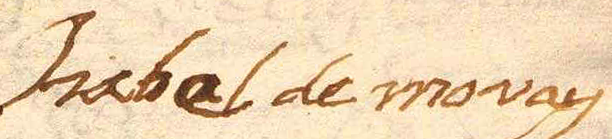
Izabel de moraes
